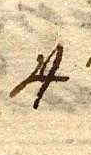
4o
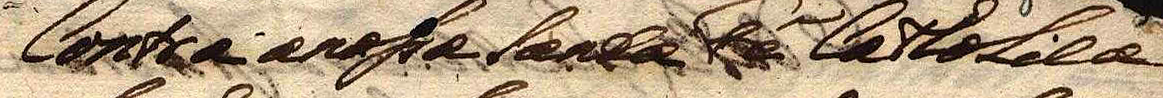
Contra a nossa santa Fé CathoLica
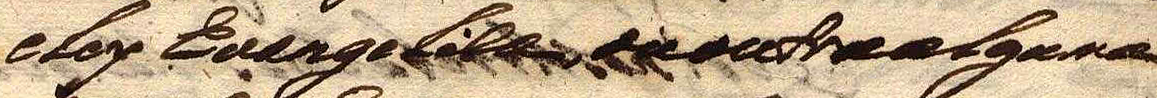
e Ley EvangeLica ou outra aLguma
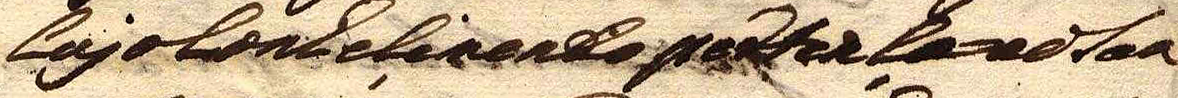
Cujo ConheÇimento pertenÇa ao San
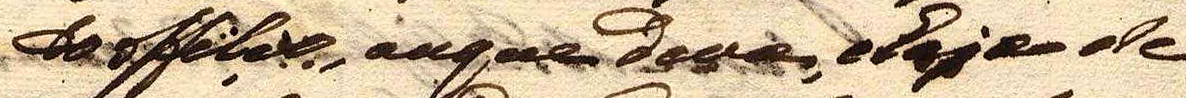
to offiÇio, ou que deva, e haja de
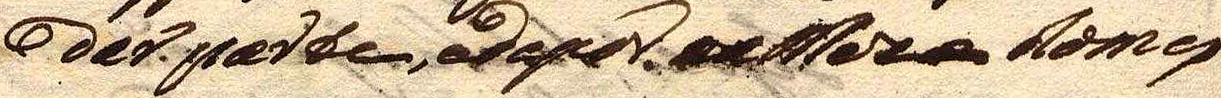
dar parte, e depor aa Meeza do mes
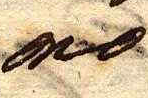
mo
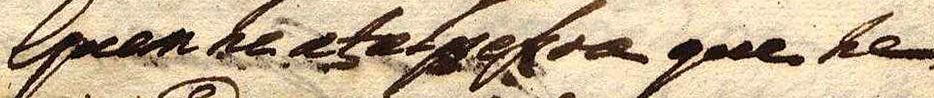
Quem he a taL pessoa que he
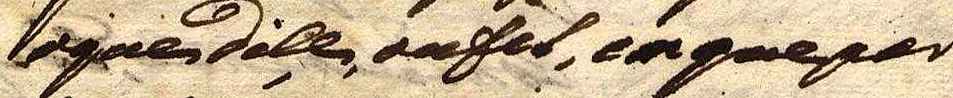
a que diçe, ou fes, em que par
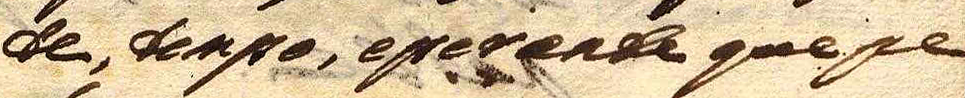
te, tempo, e perante que pe
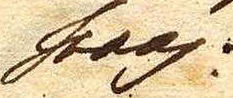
ssoas:
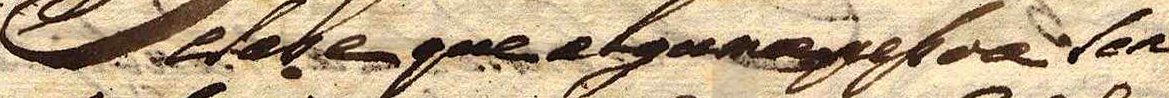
Se Sabe que alguma pessoa sen
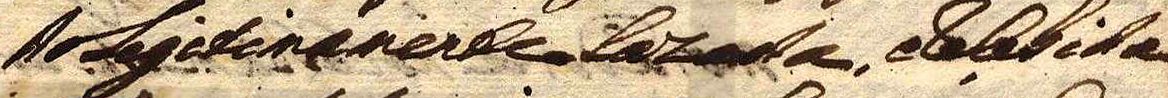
do Legitimamente Cazada, e ReÇebida
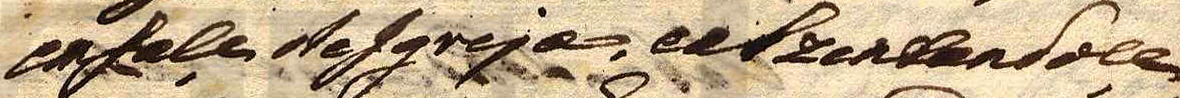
em faÇe de Jgreja, e a Izentandoçe
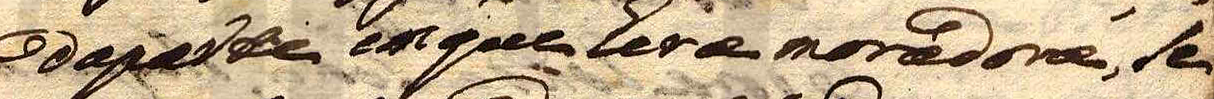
da parte em que hera moradora, se
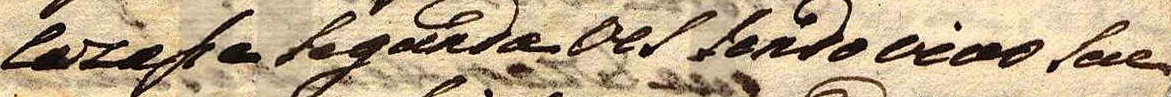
cazase segunda ves sendo viv seu
